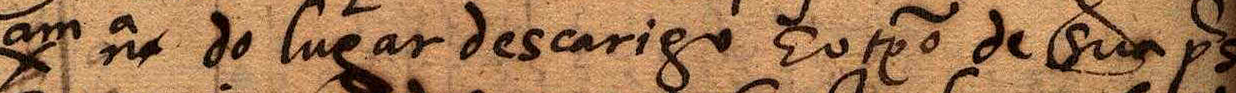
Xam nao do lugar descarigo E o tpō de sua p̄s
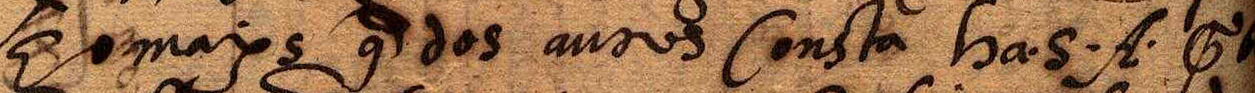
E o mays q̄ dos autos Consta ha .S. A. p̄o be
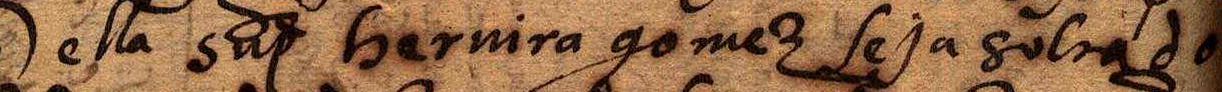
q̄ ella supte heruira gomez seja solta do
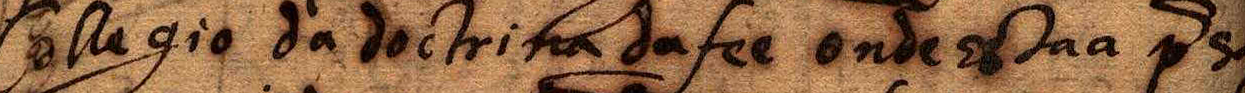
Collegio da doctrina da fee onde Estaa p̄sa
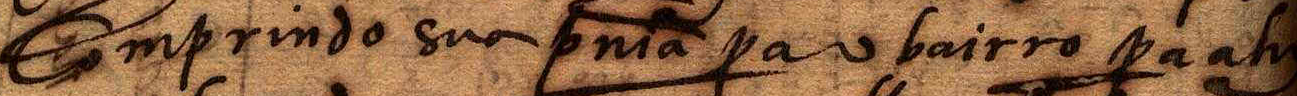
Comprindo sua pn̄ia ꝑa o bairro ꝑa ahy
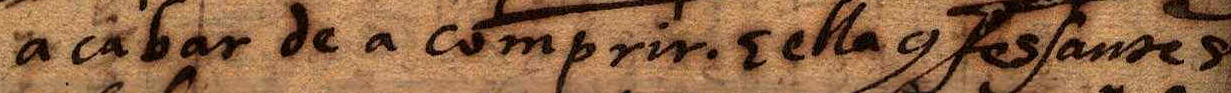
acabar de a comprir E ella ꝯfessante se
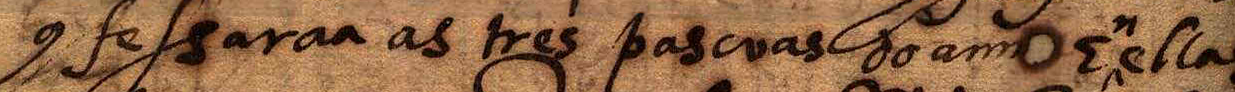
ꝯfessaraa as tres pascoas do ann_ E nellas
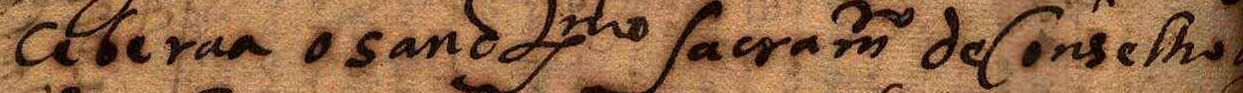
caberaa o sanctꝭmo Sacramto de Conselho
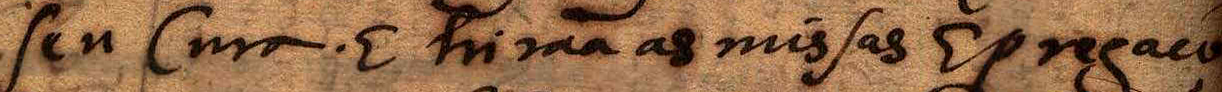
seu Cura. E hiraa as missas E pregaço
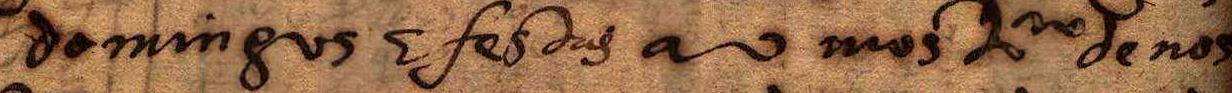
domingos E festas ao mostro de nos
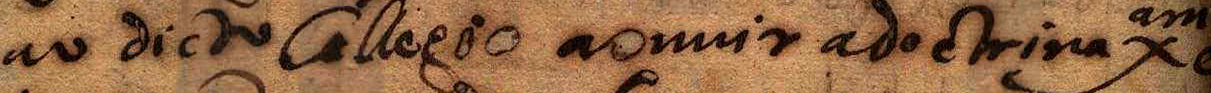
ao dicto Collegio a ouuir a doctrina Xam e
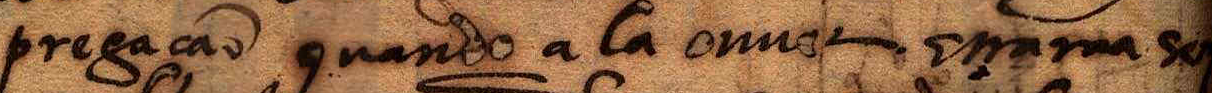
pregaçaõ quando a la ouuer E traraa se
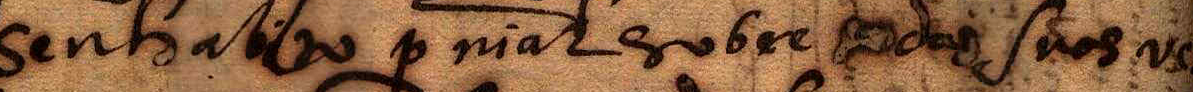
Seu habito pn̄iaL sobre _das suas ve
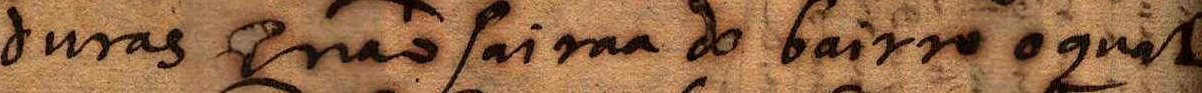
duras E não sairaa do bairro o qual
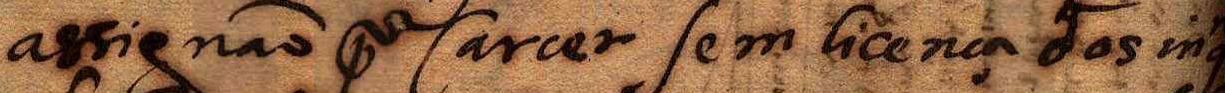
assignão p̄o Carcer sem licença dos inq
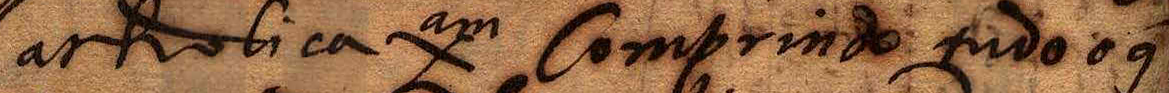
Catholica Xam Comprindo tudo o q̄
